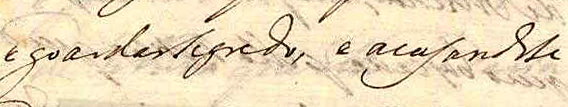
e goardar segredo, e acusandose
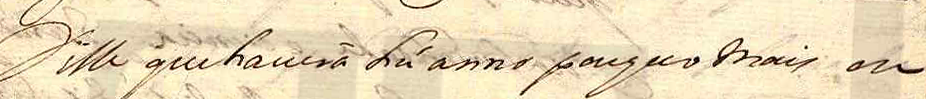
Disse que hauerá hū anno pouquo mais ou
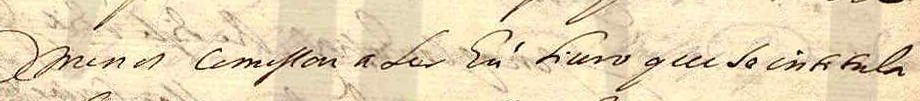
menos comessou a ler hū liuro que se intitula
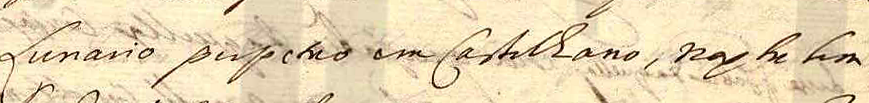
Lunario perpetuo em Castelhano, naõ he lem
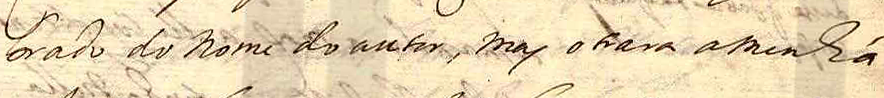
brado do nome do autor, mas o trara amenhã
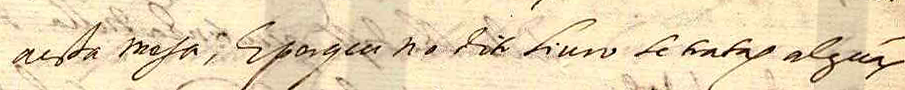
a esta mesa, E porque no dito liuro se trataõ alguās
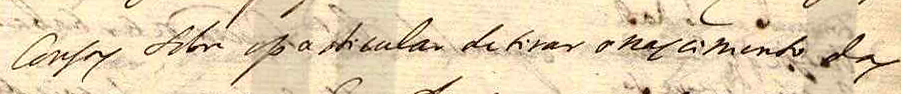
cousas sobre o particular de tirar o nascimento das
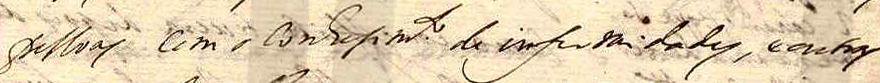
pessoas com o conhesim.to de infermidades, e outras
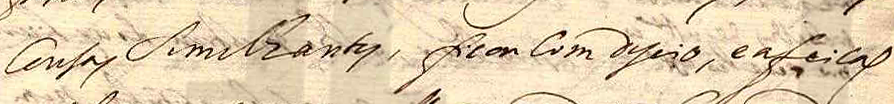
Cousas semelhantes, ficou com deseio, e afeiçaõ
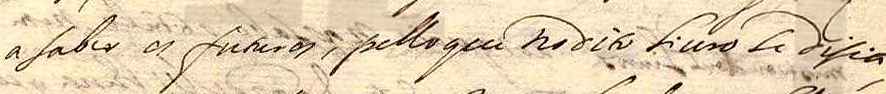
a saber os futuros, pello que no dito liuro se disia
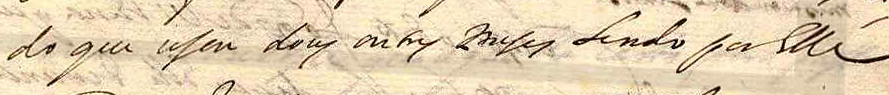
do que usou dous ou tres meses sendo por elle
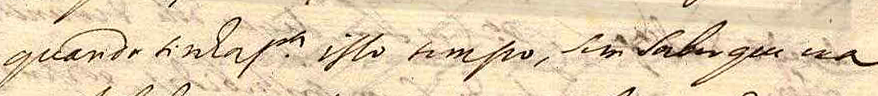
quando tinha pa. isso tempo, sem saber que era
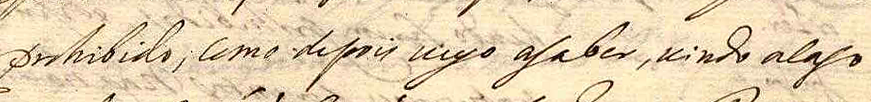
prohibido, como depois ueyo a saber, uindo acaso
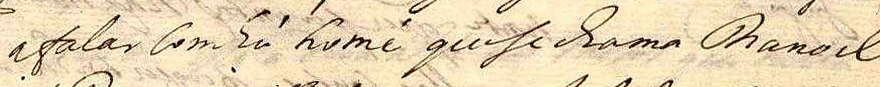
a falar com hū homē que se chama Manoel
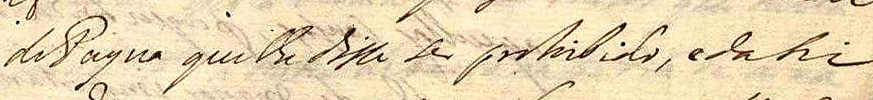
de Payua que lhe disse ser prohibido, e dahi
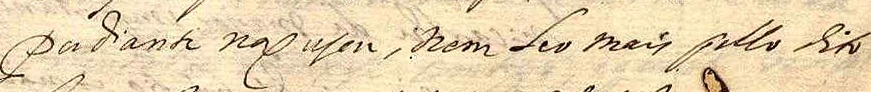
por diante naõ usou, nem Leo mais pello dito
